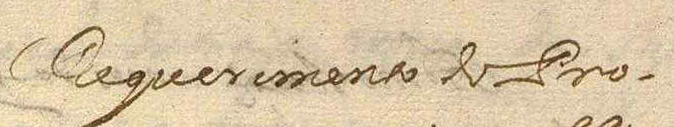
Requerimento do Pro
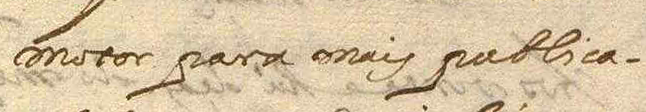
motor para mais publica
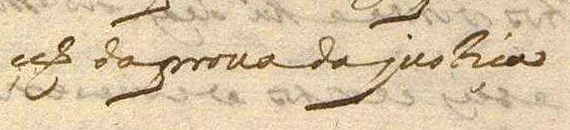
çaõ da proua da justiça
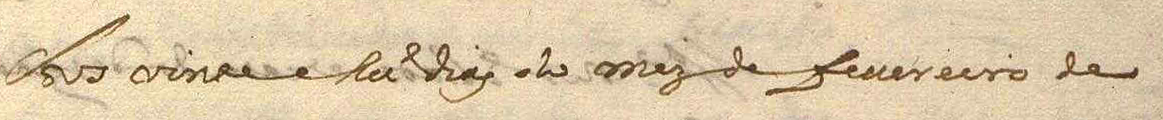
Aos vinte e hū dias do mes de feuereiro de
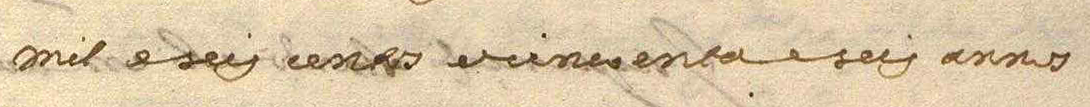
mil e seiscentos e cincoenta e seis annos
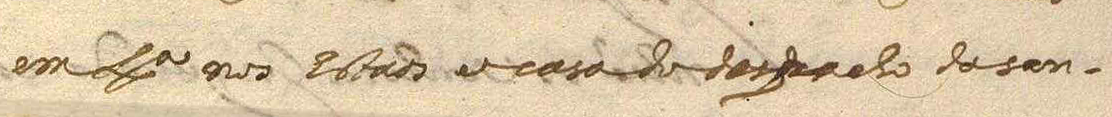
em Lxa nos Estaos e casa do despacho da san
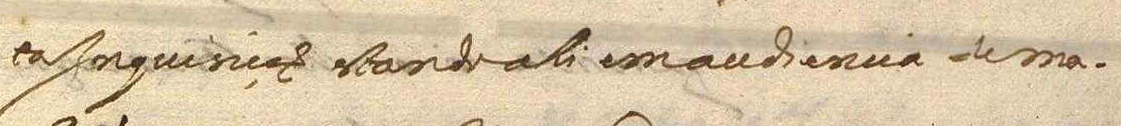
ta Jnquisiçaõ estando ahi em audiencia de ma
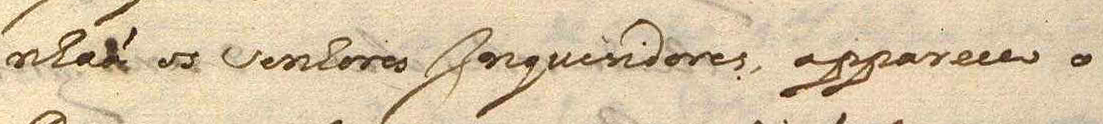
nhaã os senhores Jnquisidores, appareceo o
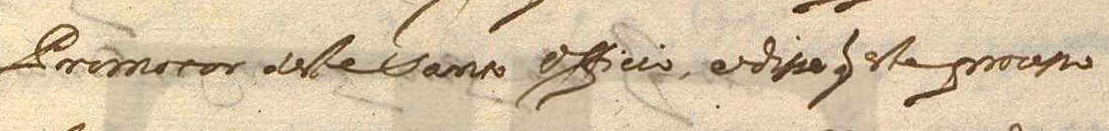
Promotor deste santo officio, e disse q̄ este processo
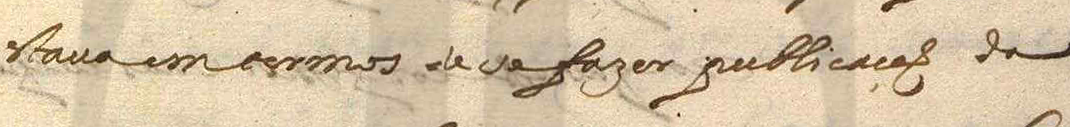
estaua em termos de se fazer publicaçaõ da
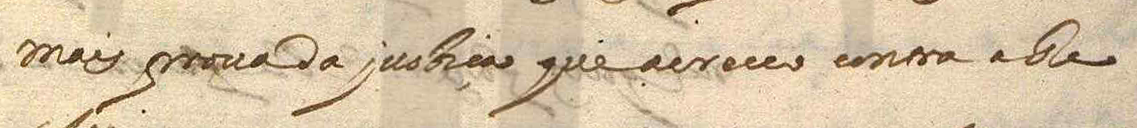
mais proua da justiça que acreceo contra a Re
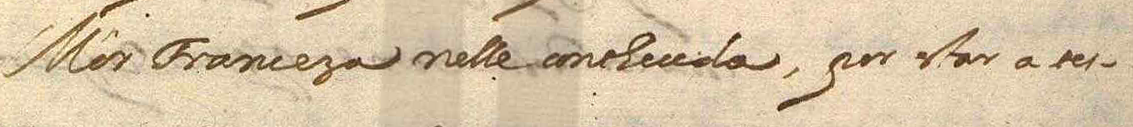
Mór Franceza nelle contheuda, por estar a tes
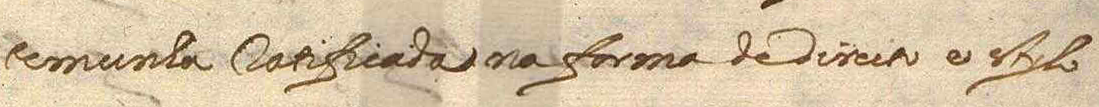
temunha Ratificada na forma de direito e estylo
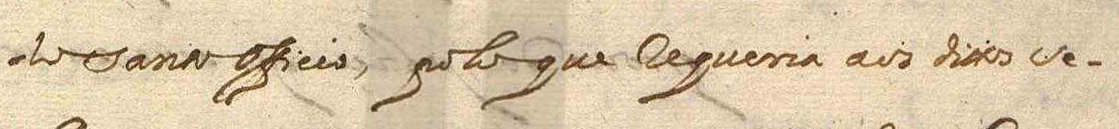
do santo officio, polo que Requeria aos dittos se
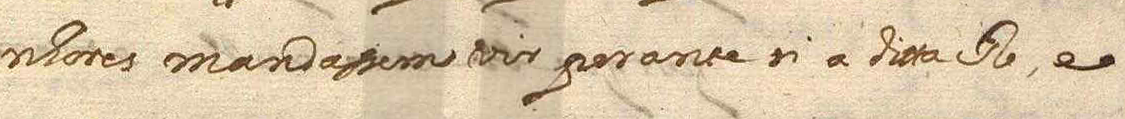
nhores mandassem vir perante si a ditta Re, e
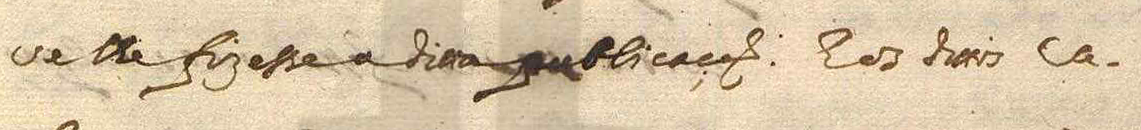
se lhe fizesse a ditta publicaçaõ: E os dittos se
